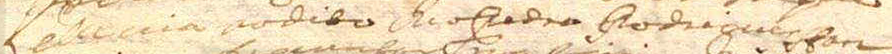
elle uia ao dito Reo Pedro Rodrigues Han
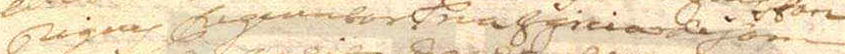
Riques frequentar na Jgreia de sam
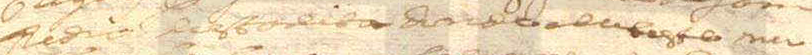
Pedro desta dita donde elle testemu
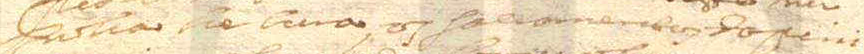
nha he cura, os sacramentos da peni
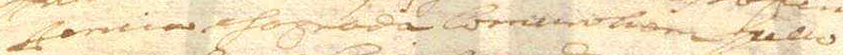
tencia e sagrada Comunham pello
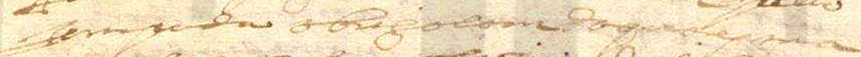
tempo da obrigacam da quaresma,
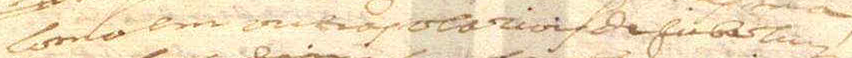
como em outras ocaziois de jubeleu
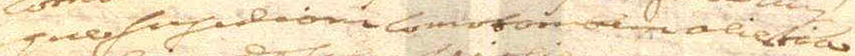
que susediam como tambem acistia
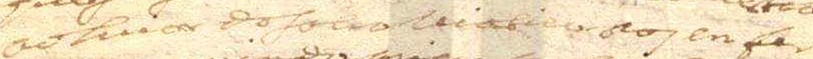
ao leuar do sacro viatico aos enfer
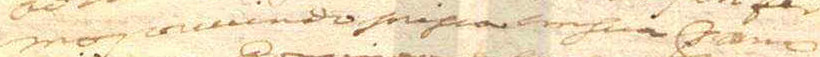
mos ouindo missa em sua Parro
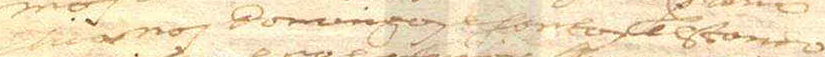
chia nos Domingos e santos estando
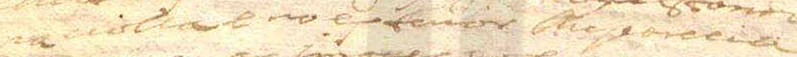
na uilla e no exterior lhe parecia
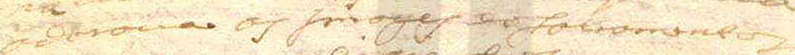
adoraua as jmages e o sacramentos
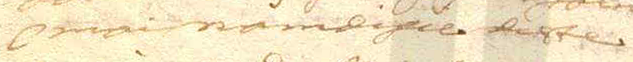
e mais nam disse deste
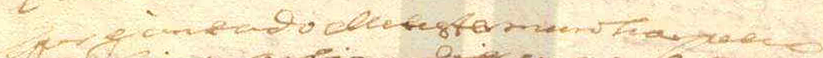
perguntado elle testemunha pello
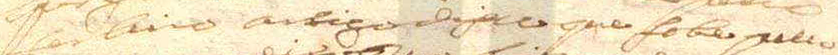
terceiro artigo disse que sabe pello
